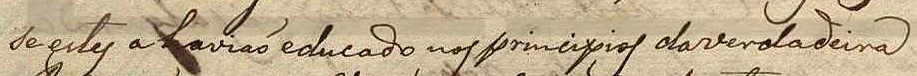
se estes a haviaõ educado nos principios da verdadeira
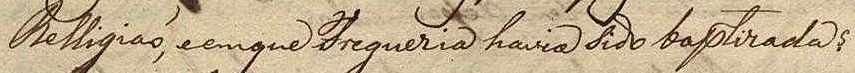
Relligiaõ, e em que Freguezia havia sido baptizada?
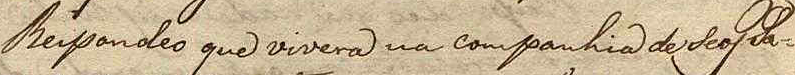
Respondeo que vivera na companhia de seos Pa
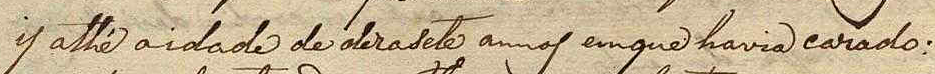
is athé a idade de dezasete annos em que havia cazado:
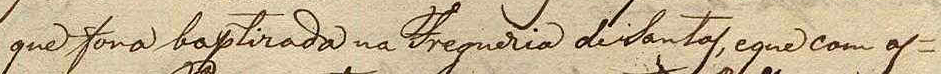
que fora baptizada na Freguezia de Santos, e que com os
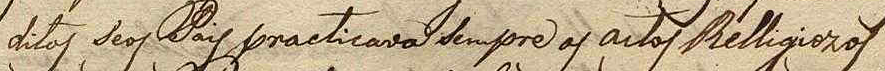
ditos seos Pais practicava sempre os actos Relligiozos
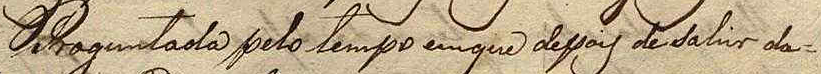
Proguntado pelo tempo em que depois de sahir da
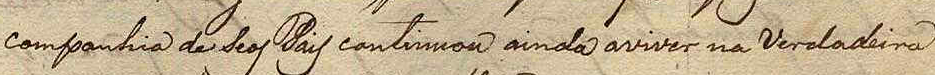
companhia de seos Pais continuou ainda a viver na Verdadeira
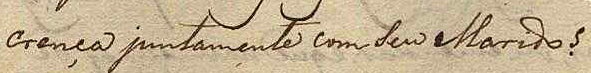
crença juntamente com seu Marido?
